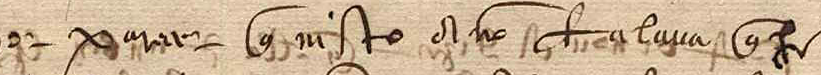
por parecer q̄ nisto A nō falaua q̄ he
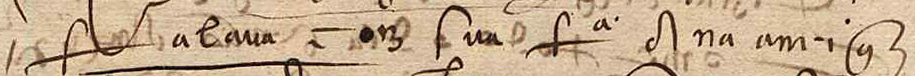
falaua com sua fa Ana amriq̄z
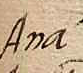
Ana
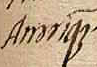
Amriq̄z
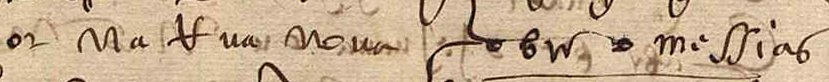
mor na Rua noua sobre o messias
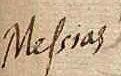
Messias
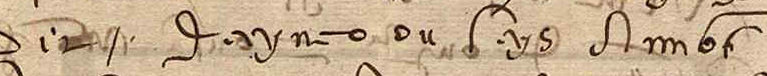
vir /. de cynco ou seys Annōs
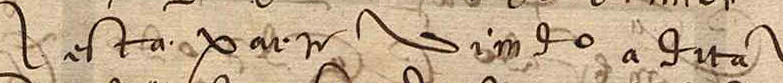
A esta parte vimdo a ditā
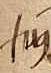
tp̄ꝯ
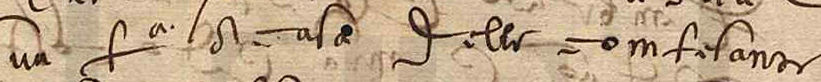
sua fa. A casa delle comfesante
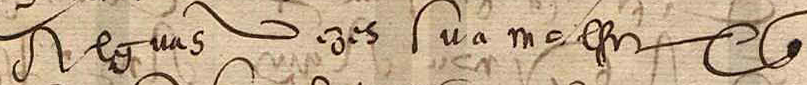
Alguās vezes sua molher e q̄
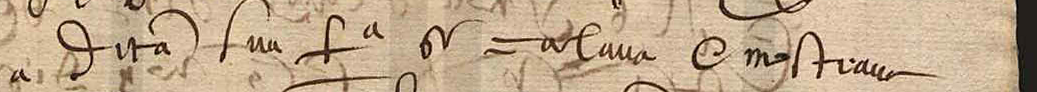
a ditā sua fa se calaua e mostraua
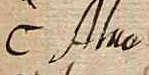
Ca Alue
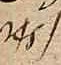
res/
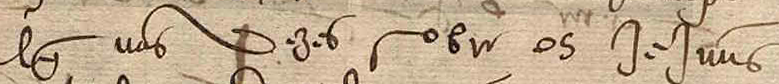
Alguās vezes sobre os JeJuūs
